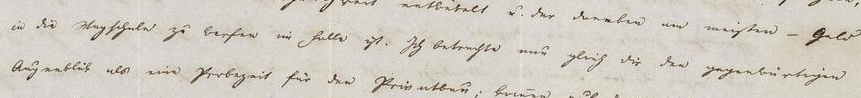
in die Wagschale zu werfen im Falle ist. Ich betrachte nun gleich Dir den gegenwärtigen
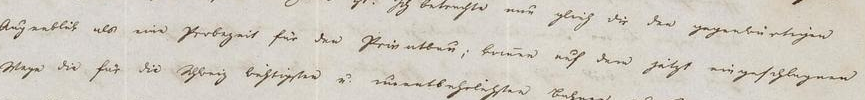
Augenblick als eine Probezeit für den Privatbau; kommen auf dem jetzt eingeschlagnen
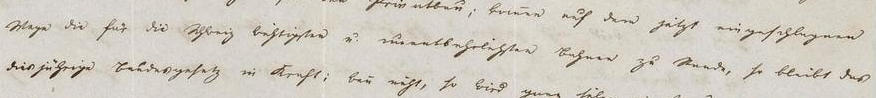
Wege die für die Schweiz wichtigsten u. unentbehrlichsten Bahnen zu Stande, so bleibt das
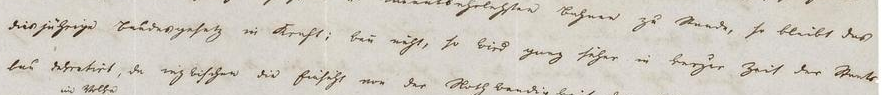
diesjährige Bundesgesetz in Kraft; wenn nicht, so wird ganz sicher in kurzer Zeit der Staats-
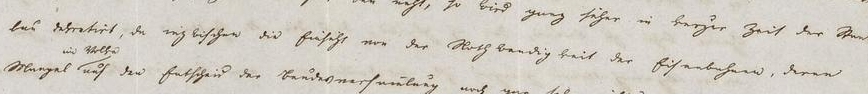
bau dekretirt, da inzwischen die Einsicht von der Nothwendigkeit der Eisenbahnen, deren
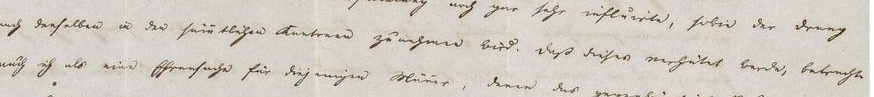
nach denselben in den sämmtlichen Kantonen zunehmen wird. Daß dieses verhütet werde, betrachte
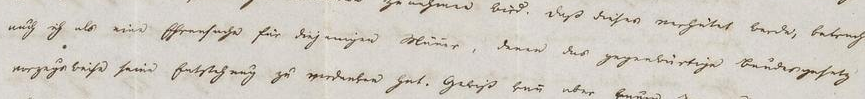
auch ich als eine Ehrensache für diejenigen Männer, denen das gegenwärtige Bundesgesetz
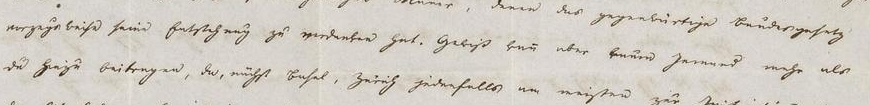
vorzugsweise seine Entstehung zu verdanken hat. Gewiß kann aber kaum Jemand mehr als
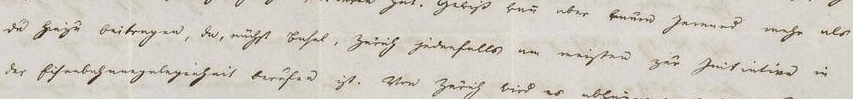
Du hierzu beitragen, da, nächst Basel, Zürich jedenfalls am meisten zur Initiation in
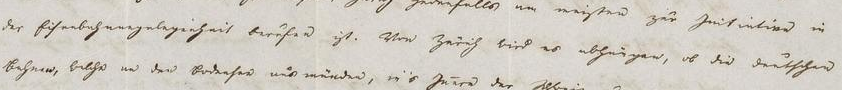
der Eisenbahnangelegenheit berufen ist. Von Zürich wird es abhängen, ob die deutschen
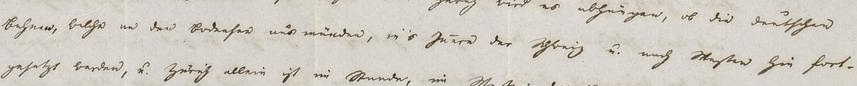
Bahnen, welche an den Bodensee aus münden, in's Innere der Schweiz u. nach Westen hin fort-
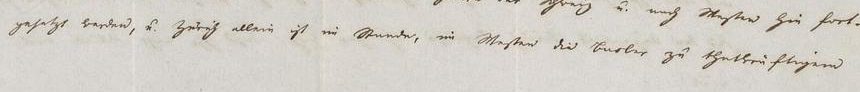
gesetzt werden, u. Zürich allein ist im Stande, im Westen die Basler zu thatkräftigem
